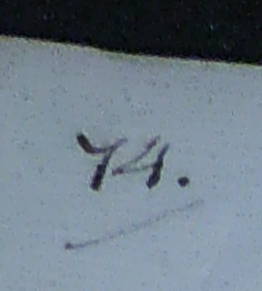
74.
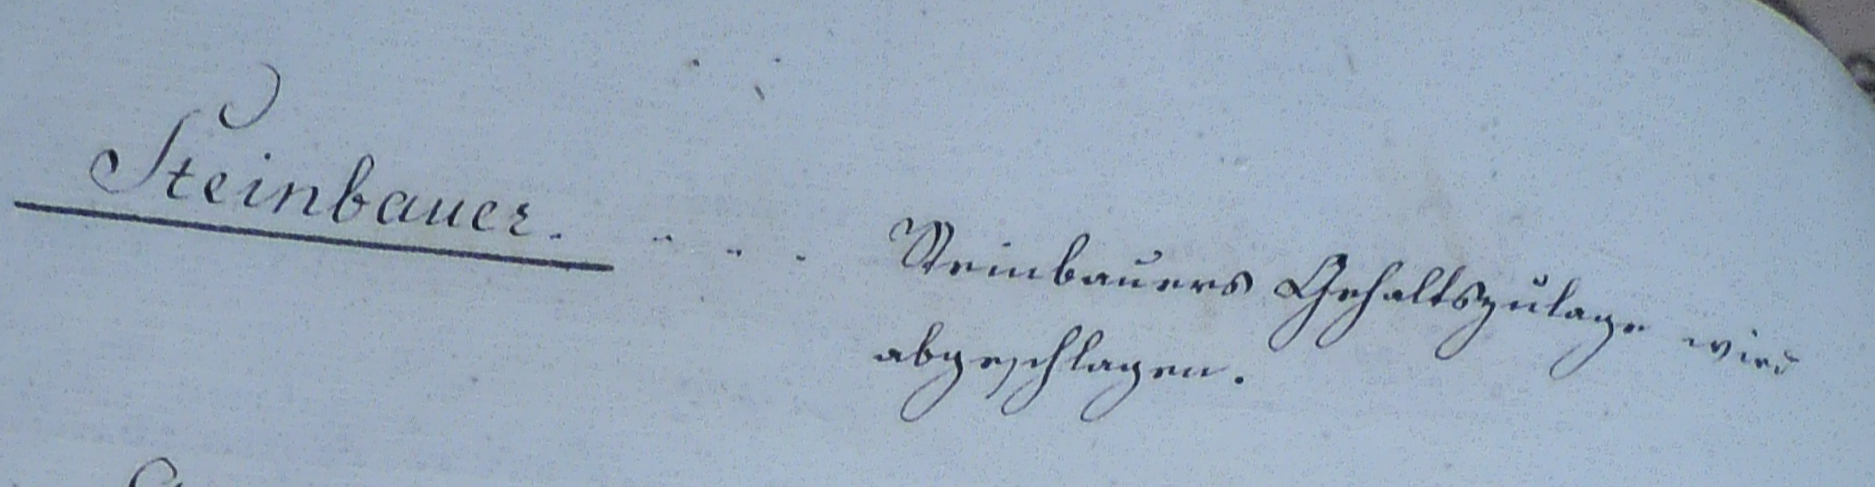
Steinbauer. .. .. . Steinbauers Gehaltszulage wird
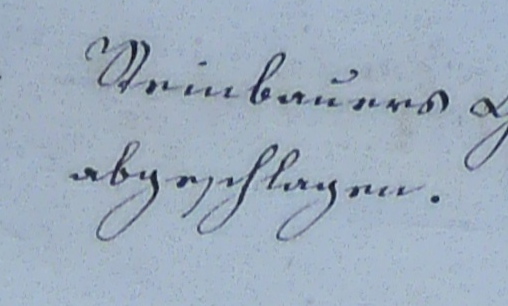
abgeschlagen.
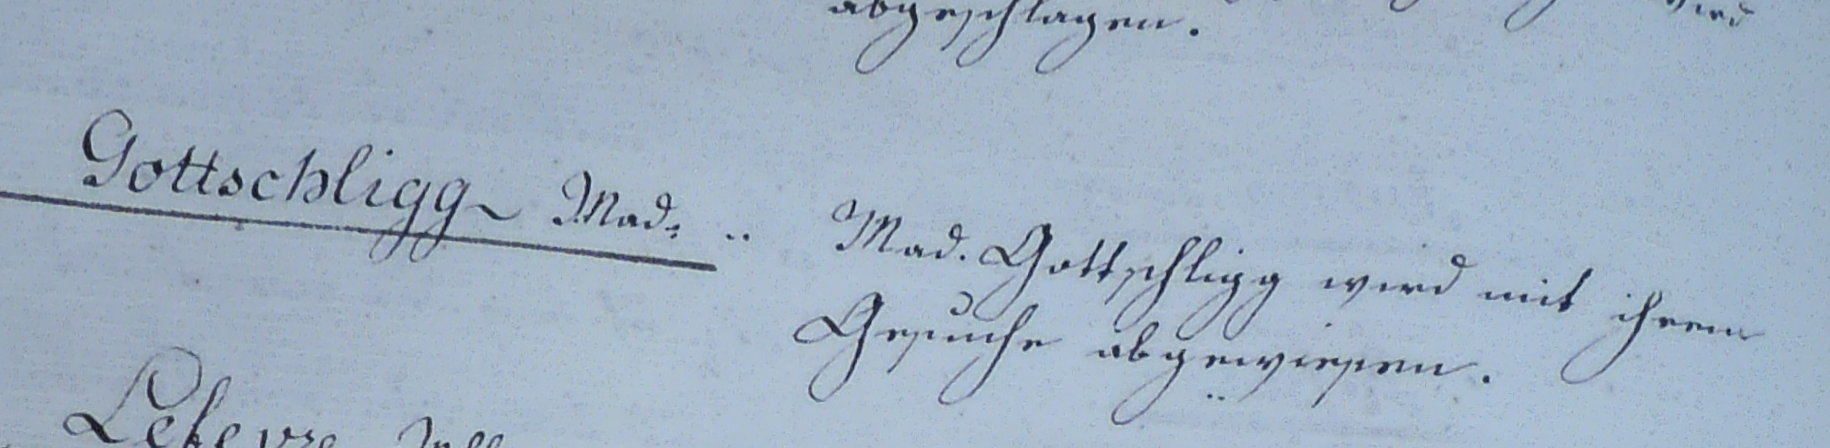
Gottschligg Mad: .. Mad. Gottschligg wird mit ihrem
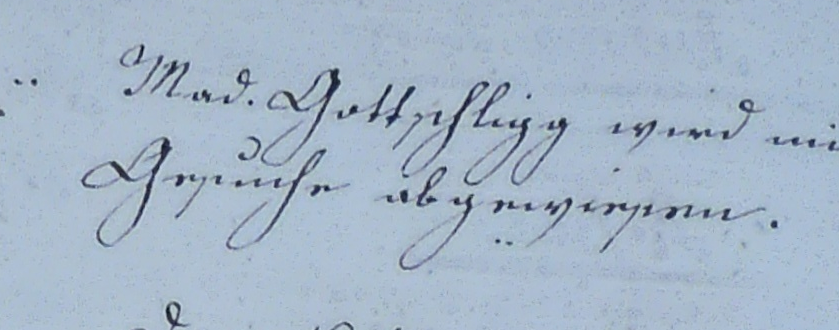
Gesuche abgewiesen.
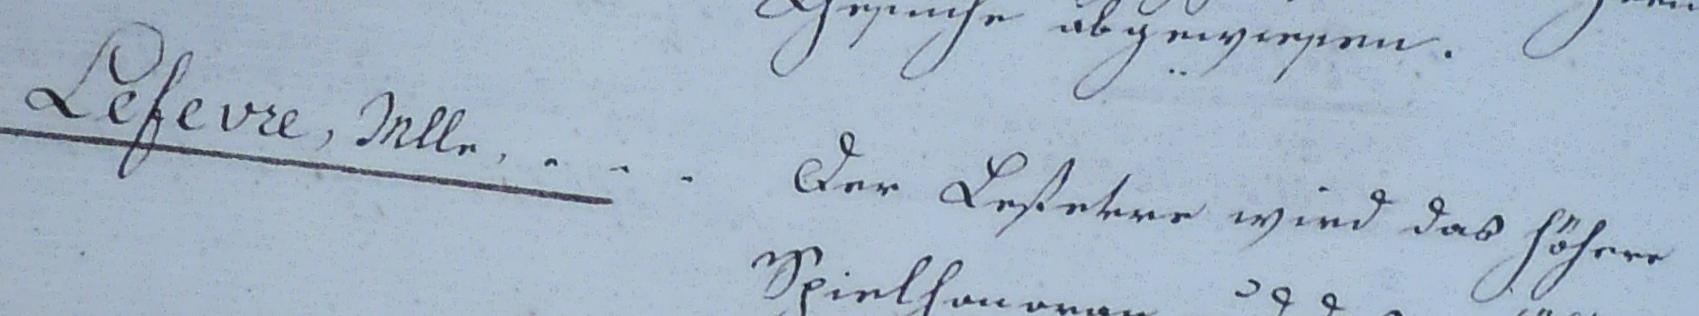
Lefevre, Mlle. .. .. .. Der Lefevre wird das höhere
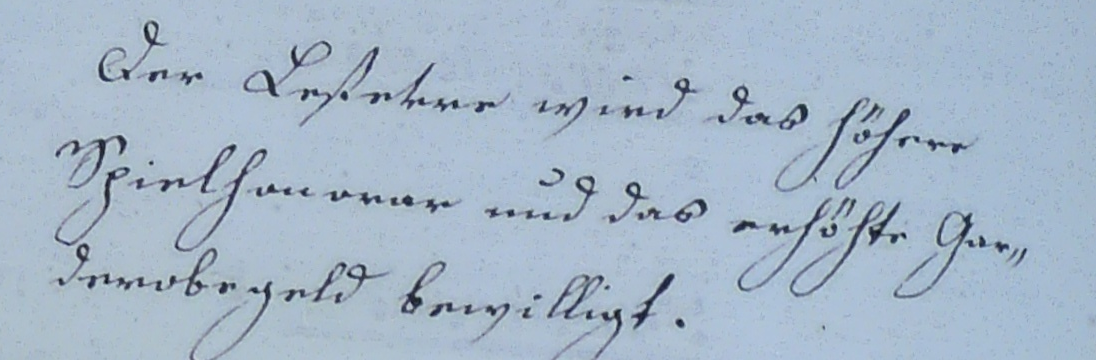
Spielhonorar und das erhöhte Gar¬
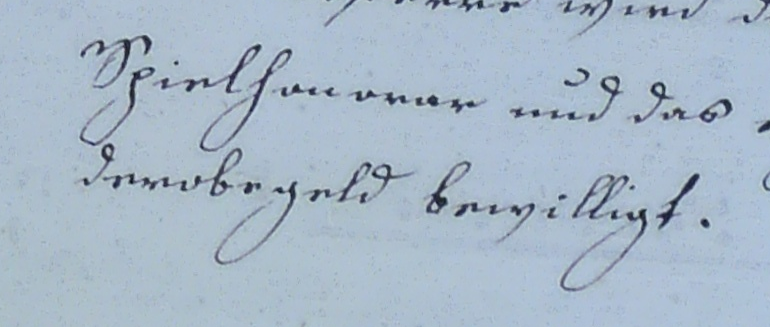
derobegeld bewilligt.
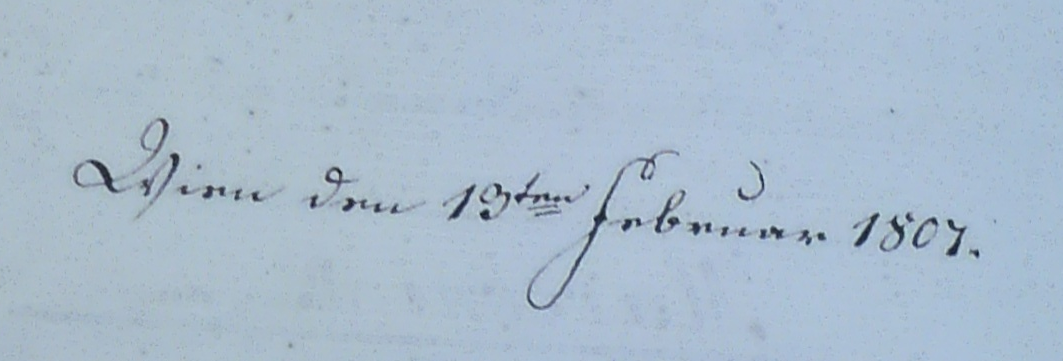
Wien den 13te͇n Februar 1807.
